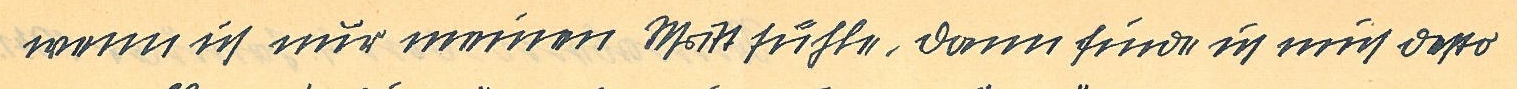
wenn ich nur meinen Schritt fühle, dann finde ich mich desto
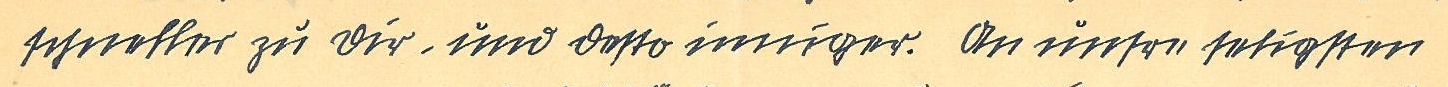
schneller zu Dir, und desto inniger. An unsre seligsten
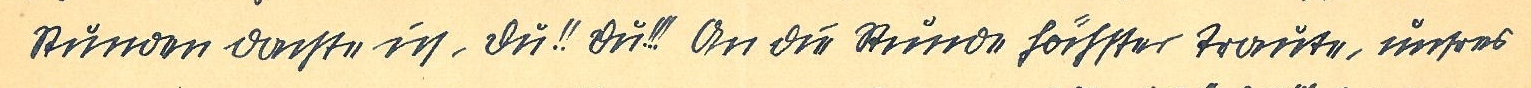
Stunden dachte ich, Du!! Du!!! An die Stunde höchster Traute, unsres
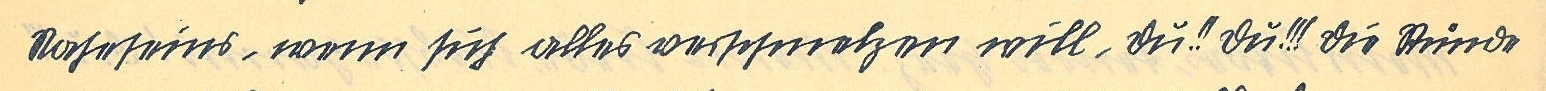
Naheseins, wenn sich alles verschmelzen will, Du!! Du!!! Die Stunde
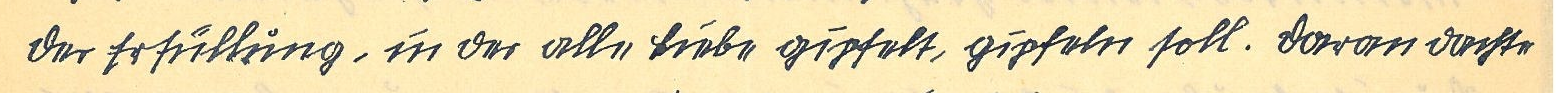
der Erfüllung, in der alle Liebe gipfelt, gipfeln soll. Daran dachte
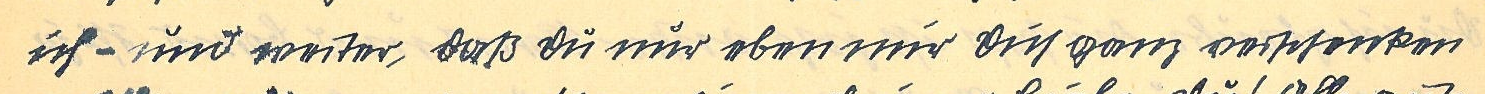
ich – und weiter, daß Du nur eben mir Dich ganz verschenken
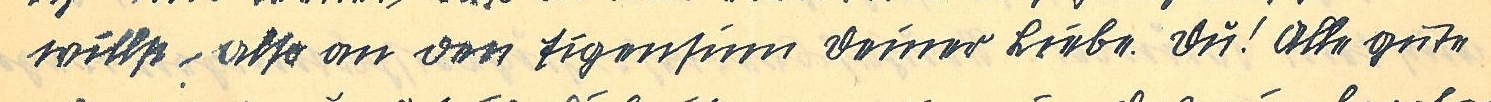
willst, also an den Eigensinn Deiner Liebe. Du! Alle gute
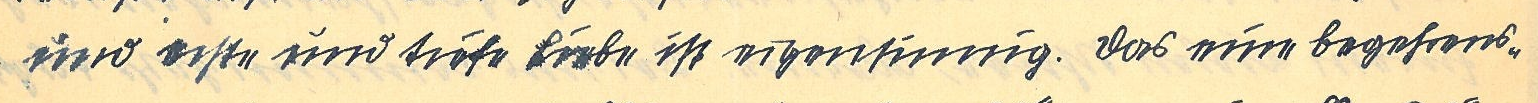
und echte und tiefe Liebe ist eigensinnig. Das eine begehrens¬
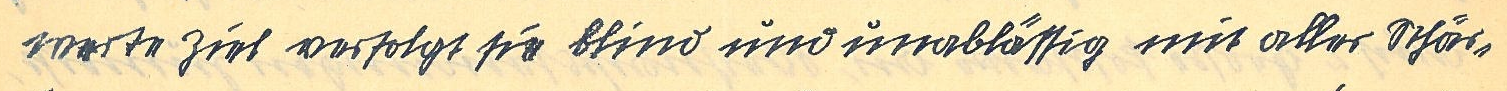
werte Ziel verfolgt sie blind und unablässig mit aller Schär¬
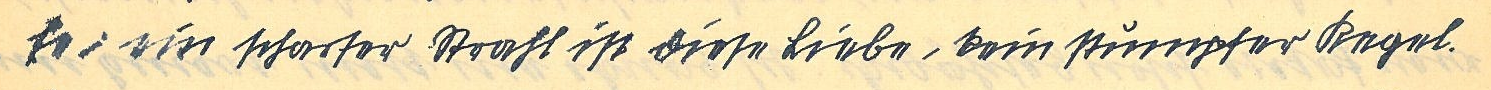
fe; ein scharfer Strahl ist diese Liebe, kein stumpfer Kegel.
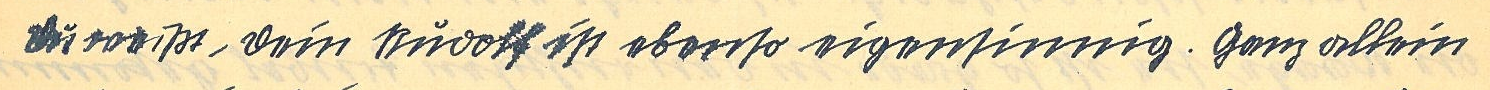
Du weißt, Dein ist ebenso eigensinnig. Ganz allein
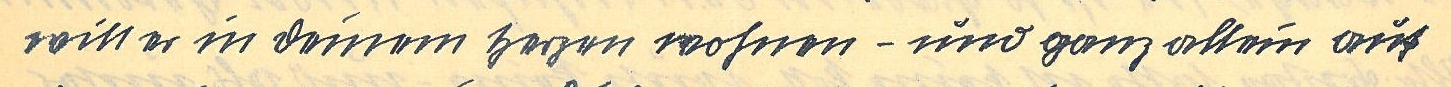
will er in Deinem Herzen wohnen – und ganz allein auf
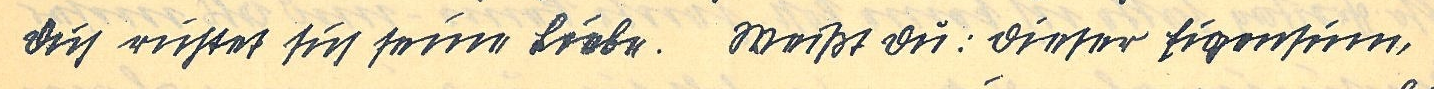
Dich richtet sich seine Liebe. Weißt Du: dieser Eigensinn,
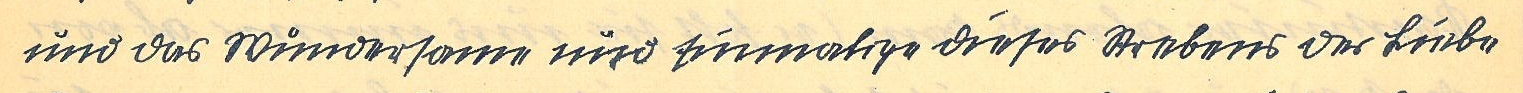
und das Wundersame und Einmalige dieses Strebens der Liebe
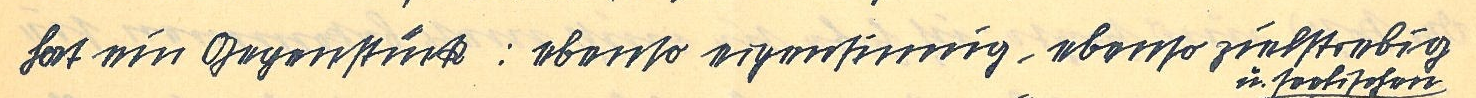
hat ein Gegenstück: ebenso eigensinnig, ebenso zielstrebig
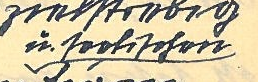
^u. seelischen
